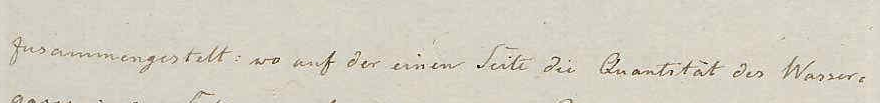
zusammengestelt: wo auf der einen Seite die Quantität des Wasser-
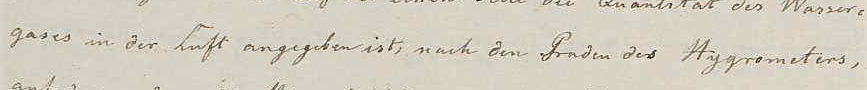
gases in der Luft angegeben ist, nach den PGraden des Hygrometers,
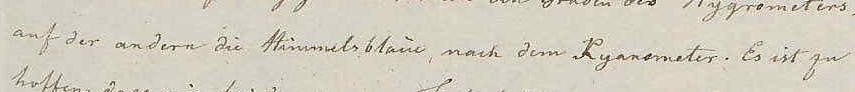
auf der andern die Himmelsbläue nach dem Kyanometer. Es ist zu
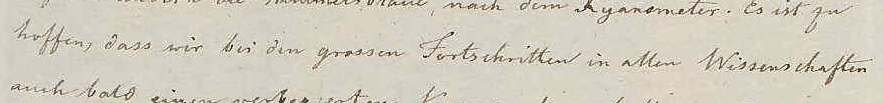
hoffen, dass wir bei den grossen Fortschritten in allen Wissenschaften
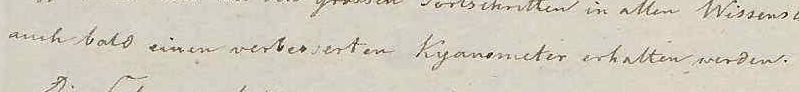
auch bald einen verbesserten Kyanometer erhalten werden.
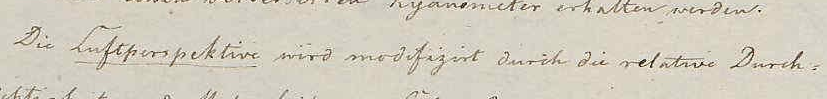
Die Luftperspektive wird modifizirt durch die relative Durch-
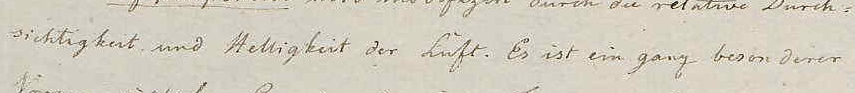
sichtigkeit und Helligkeit der Luft. Es ist ein ganz besonderer
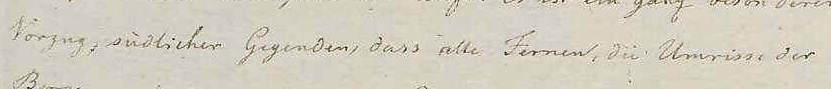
Vorzug, südlicher Gegenden, dass alle Fernen, die Umrisse der
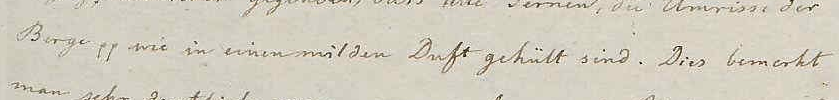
Berge pp wie in einen milden Duft gehült sind. Dies bemerkt
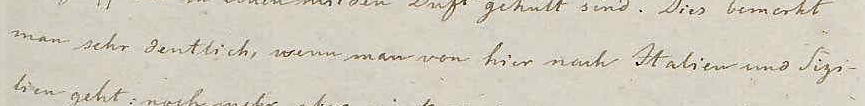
man sehr deutlich, wenn man von hier nach Italien und Sizi-
